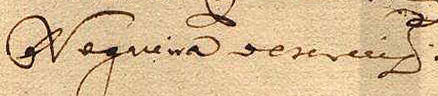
Nogueira o escreuj.
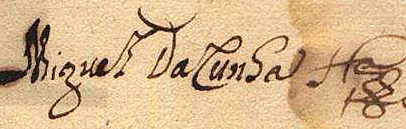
Miguel da Cunha Hes
